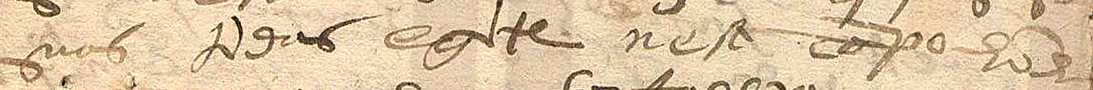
suas tēdas e gēte neste cāpo hōde
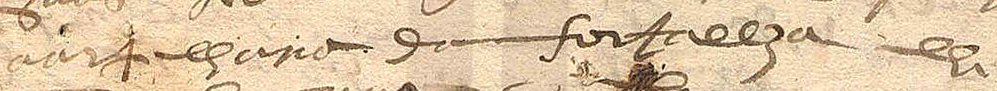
a artelharia da fortalleza lhe
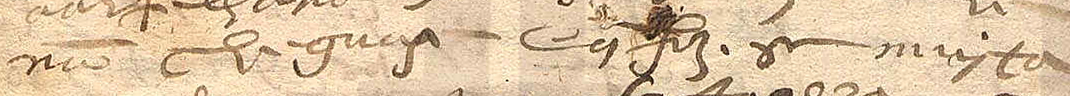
não cheguase e q̄ fizese mujta
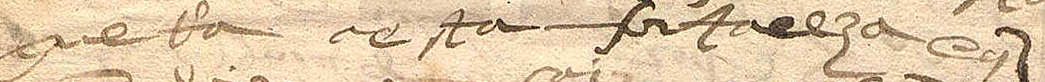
gueRa a esta fortalleza e q̄
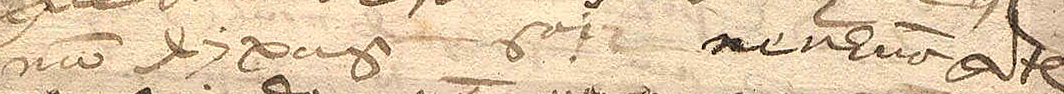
naõ dejxase sair nenhuā gēte
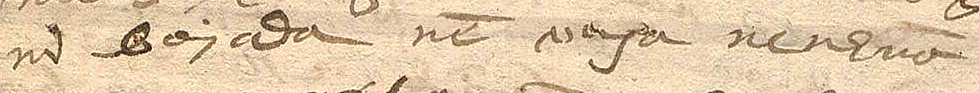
nē bojada nē cousa nenhuā
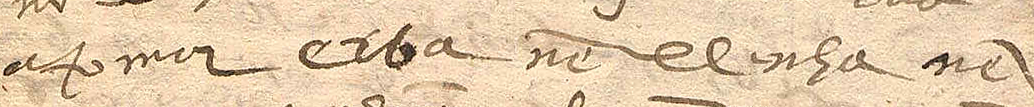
a tomar erva nē llenha nē
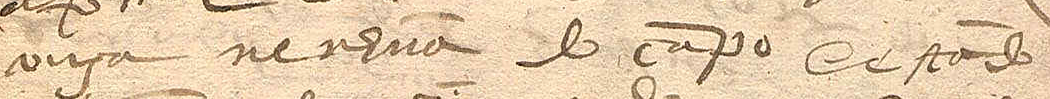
cousa nenhuā do cāpo e estādo
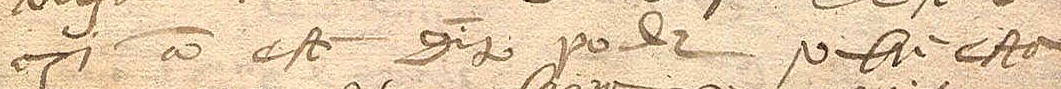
asi c̄o este dīto poder sobre esta
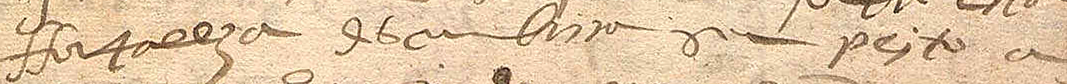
ffortalleza descubrira seu pejto a
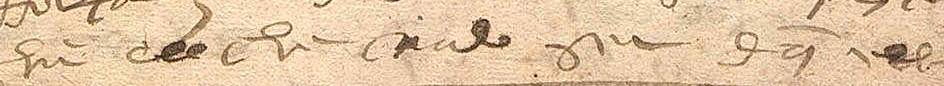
hū ellche criado seu de q̄ elle
